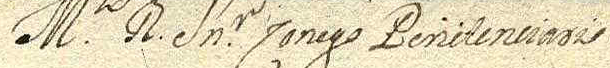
M.to R. Sn.r Conego Penitenciario
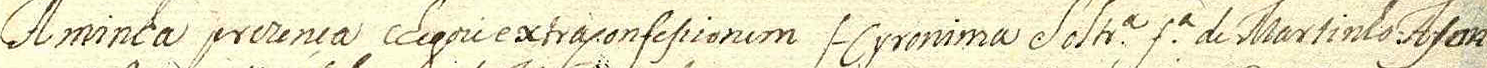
A minha prezença chegou extra Confessionem Hyronima Soltr.a f.a de Martinho Afon
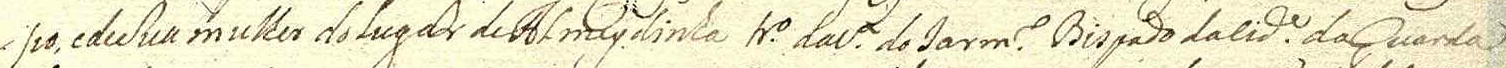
sso, e de Sua mulher do Lugar de Almeydinha tr.o da v.a do Iarm.o Bispado da cid.e da Guarda
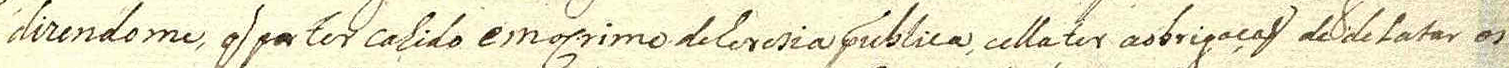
dizendo me, q̄ por ter cahido em o Crime de heresia publica, e ella ter a obrigaçaõ de deLatar os
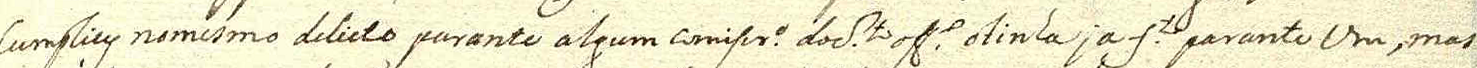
Cumplices no mesmo delicto parante algum comissr.o do S.to off.o o tinha ja f.to parante V m, mas
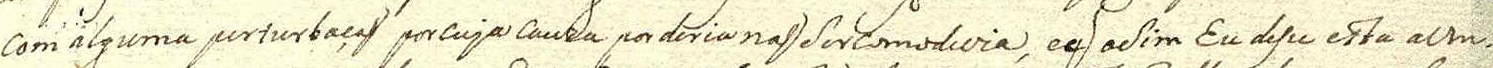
com alguma perturbaçaõ por cuja cauza porderia naõ Ser como devia, e q̄ aSim Eu desse esta a v m.
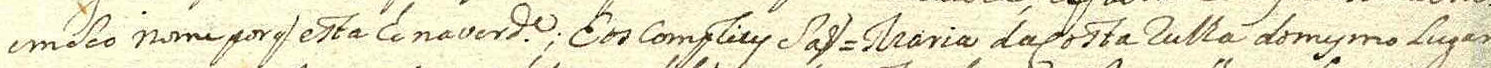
em Seo nome porq̄ esta he na verd.e; E os Complices Saõo = Maria da Costa Rulha do mesmo Lugar
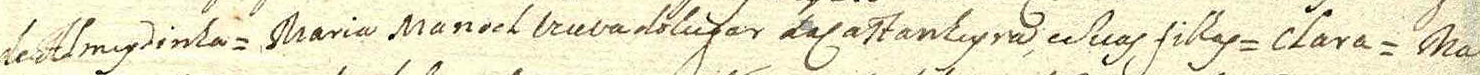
de Almeydinha = Maria Manoel viuva do Lugar da Castanheyra, e Suas filhas = CLara = Ma
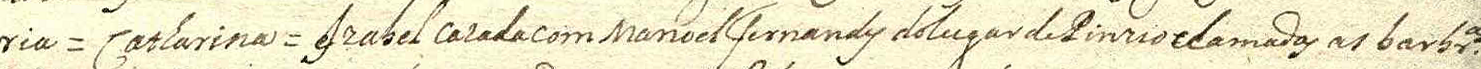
ria = Catharina = e Jzabel cazada com Manoel Fernandes do Lugar de Pinzio chamadas as barbr.as
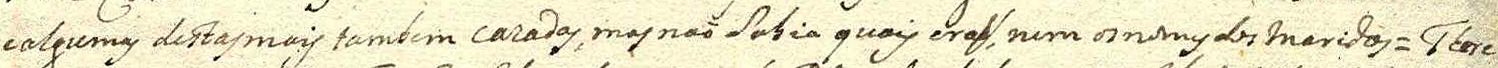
e algumas destas mais tambem cazadas, mas naõ Sabia quais eraõ, nem os nomes dos maridos = There
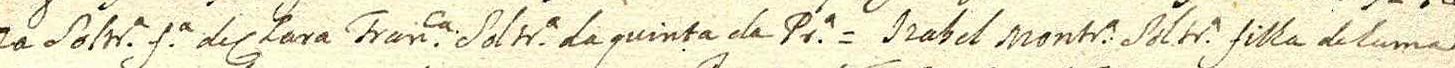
za Soltr.a f.a de CLara Fran.ca Soltr.a da quinta da Pr.a = Izabel Montr.a Soltr.a filha de huma
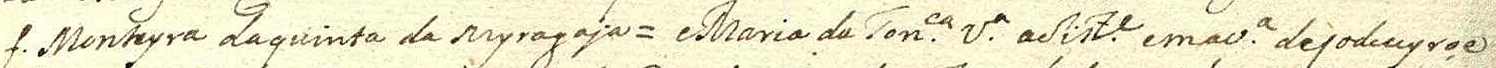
f. Monteyra da quinta da Myragaja = e Maria da Fon.ca V.a asist.e em a v.a de Codeceyro, e
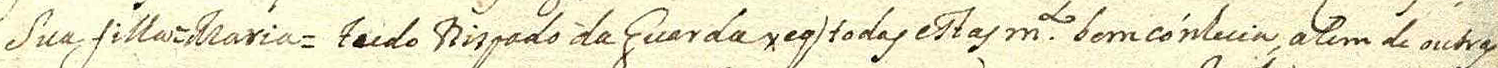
Sua filha = Maria = tudo Bispado da Guarda, e q̄ todas estas m.to bem conhecia, alem de outras
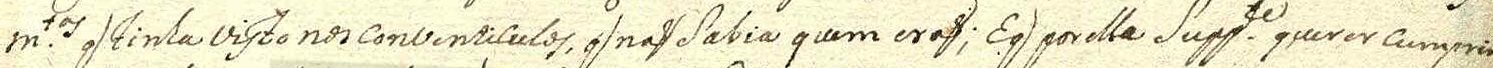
m.tas q̄ tinha visto nos conventiculos, q̄ naõ Sabia quem eraõ; E q̄ por ella Supp.te querer cumprir
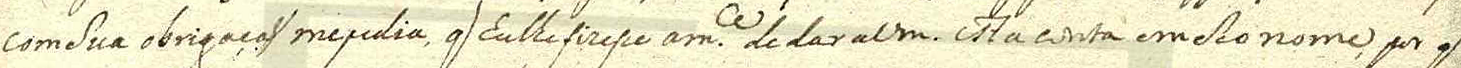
com Sua obrigaçaõ me pedia, q̄ Eu lhe fizesse a m.ce de dar a V m. esta conta em Seo nome, por q̄
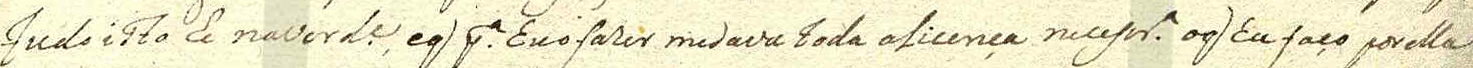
tudo isto he na verdade, e q̄ p.a Eu o fazer me dava toda a Licença necessr.a o q̄ Eu faço por ella
